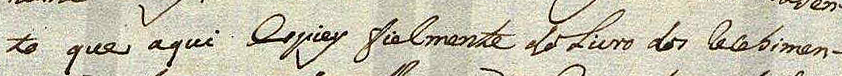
to que aqui Copiey fielmente do Livro dos Recebimen
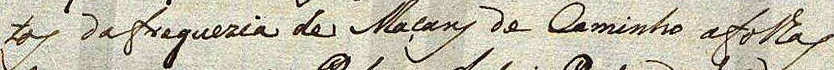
tos da freguezia de Maçans de Caminho a folhas
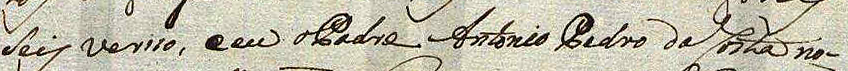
seis versso, e eu o Padre Antonio Pedro da Costa no
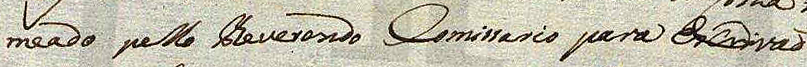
meado pello Reverendo Comissario para Escrivaõ
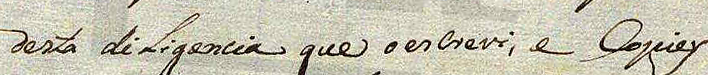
desta diLigencia que o escrevi, e Copiey
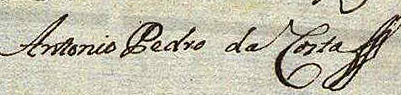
Antonio Pedro da Costa
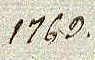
1769.
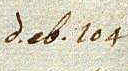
d.eb. 104
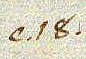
c.18.
